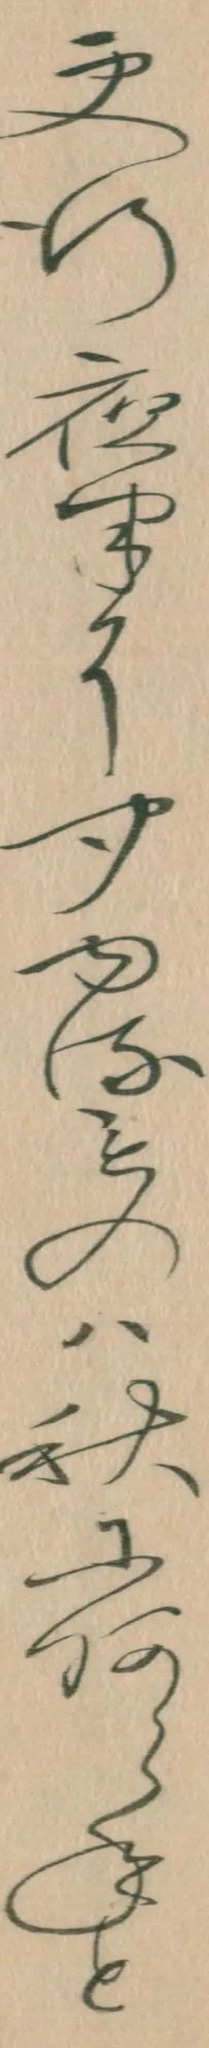更行夜半に聞ゆるものは秋にあらねと
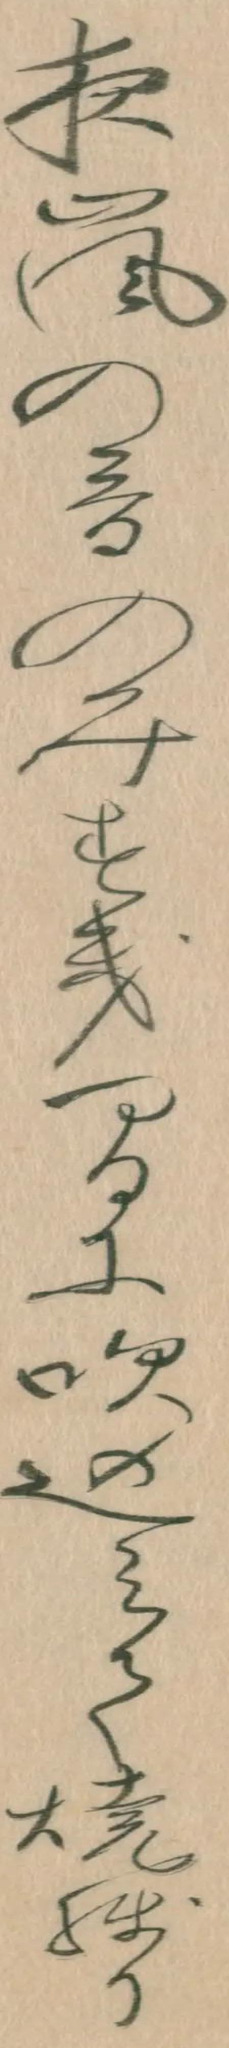夜嵐の音のみすき間に吹込みて焼残り
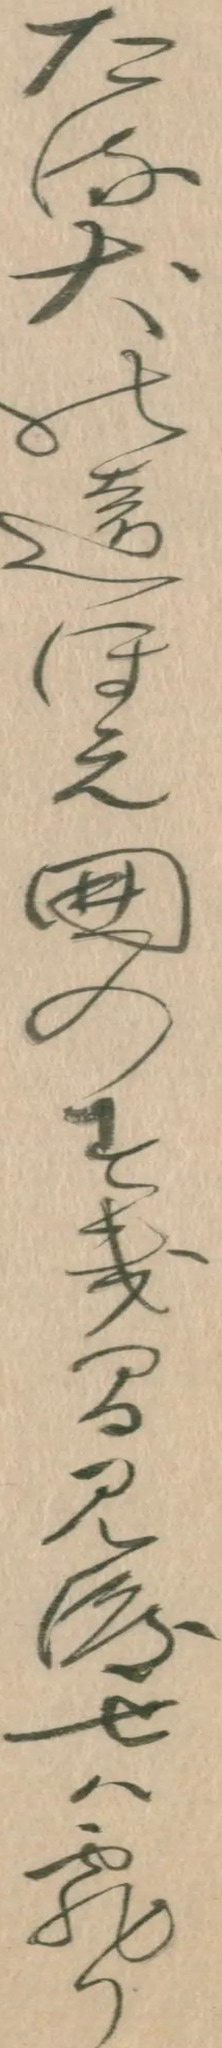たる犬の遠ほえ囲のすき間見渡せは霏り
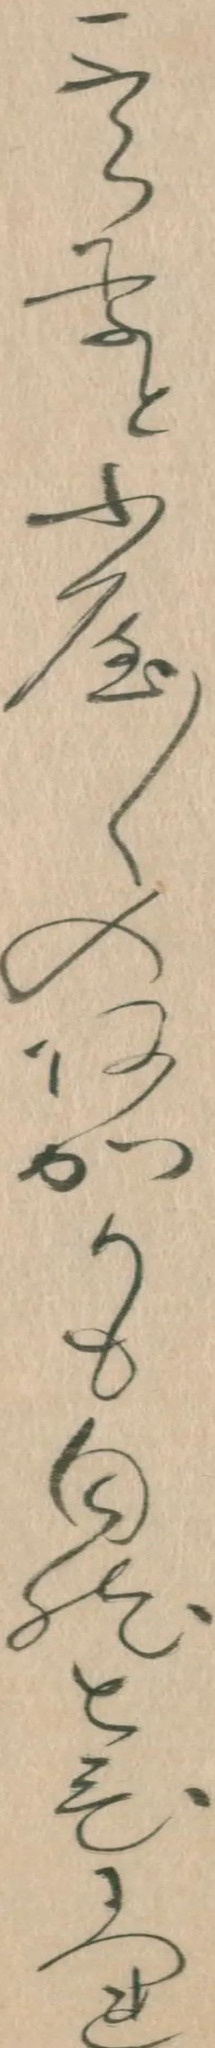ふらりと小屋〳〵のあかりも自然とひにつれ
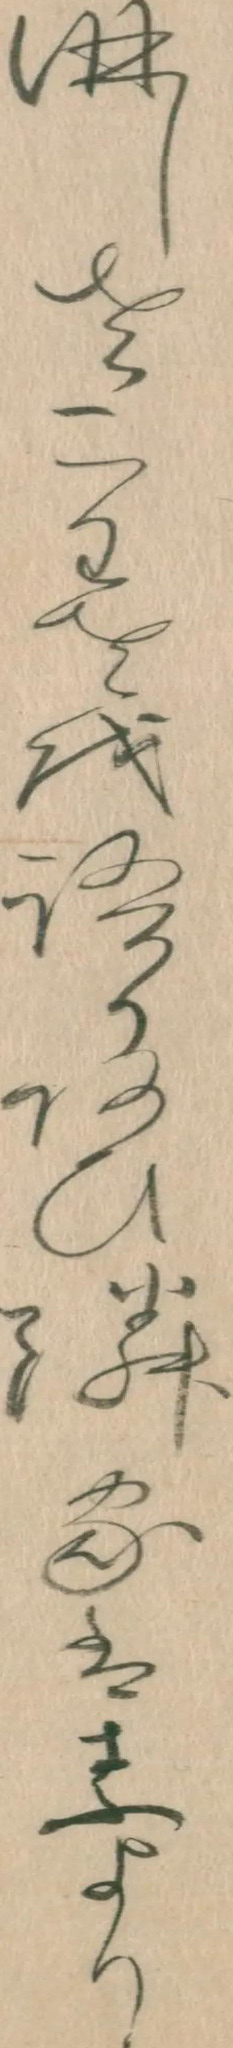淋しさこわさを語りあひ隣家は素より
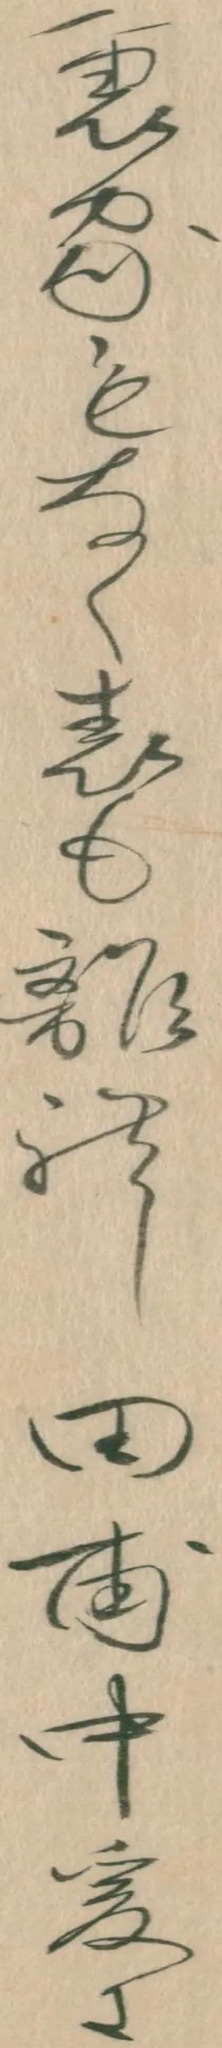裏家もなく表も離れし田甫中爰に
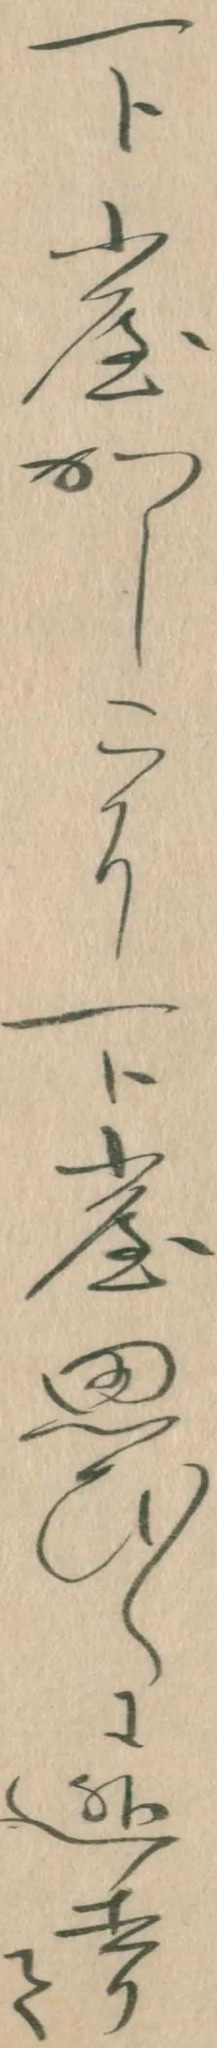一ト小屋かしこに一ト小屋思ひ〳〵に逃去りて
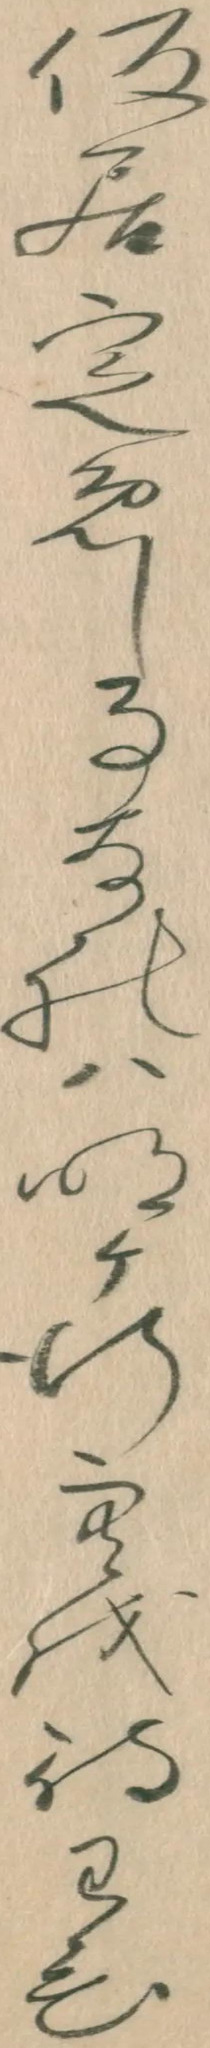仮居定めし事なれは明け行空を待わひ
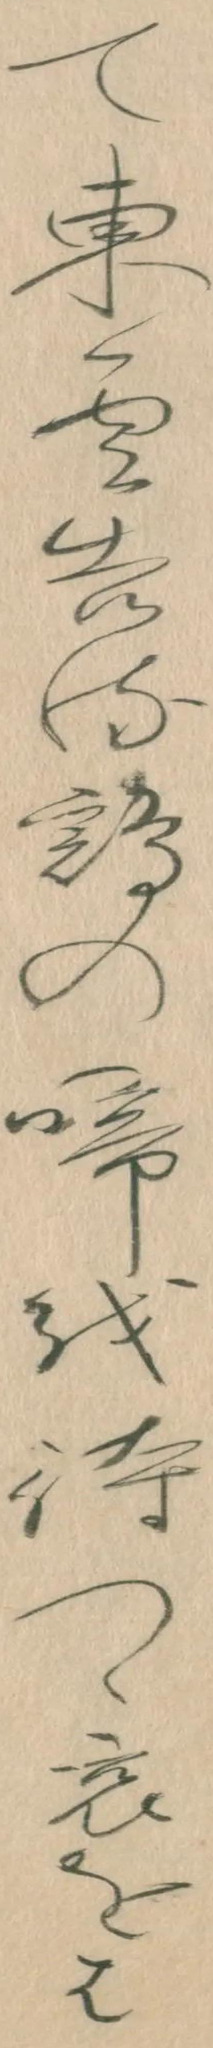て東雲告る鶏の啼を待つゝ哀をは
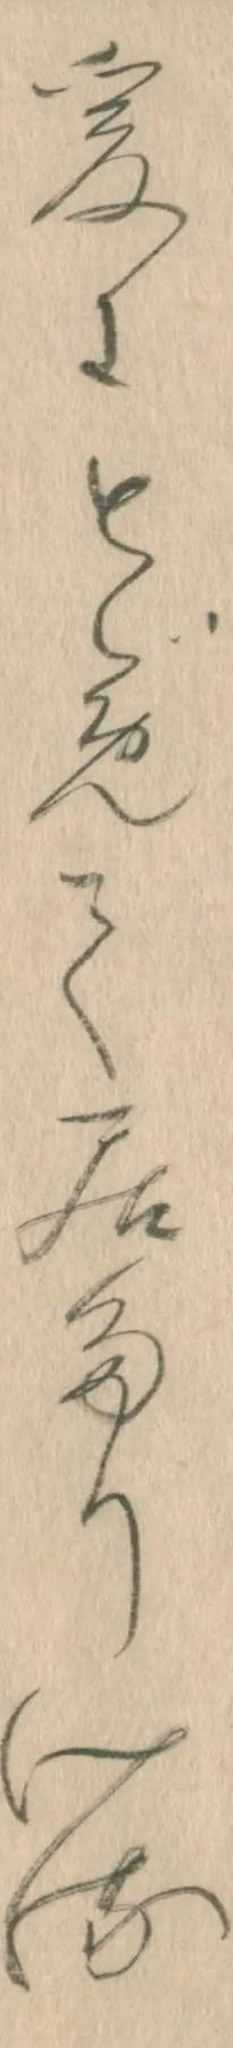爰にとゞめて居たりける

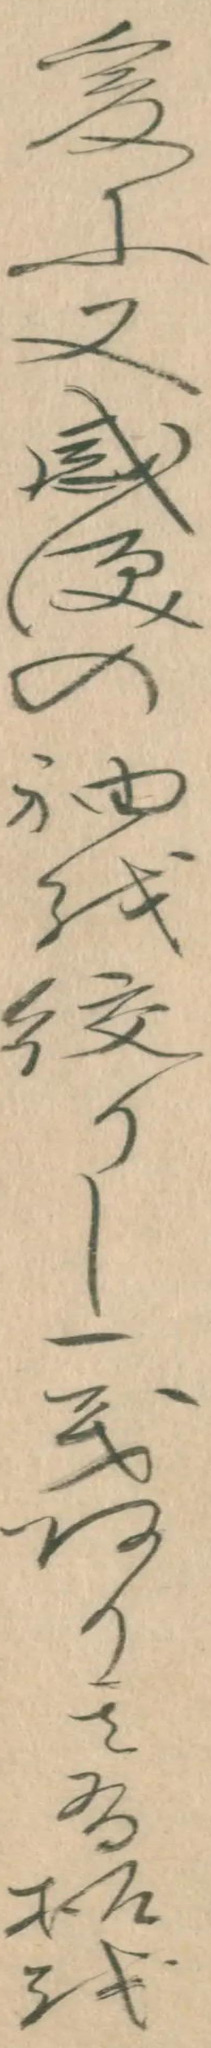爰に又感涙の袖を絞りし一義あり其有様を
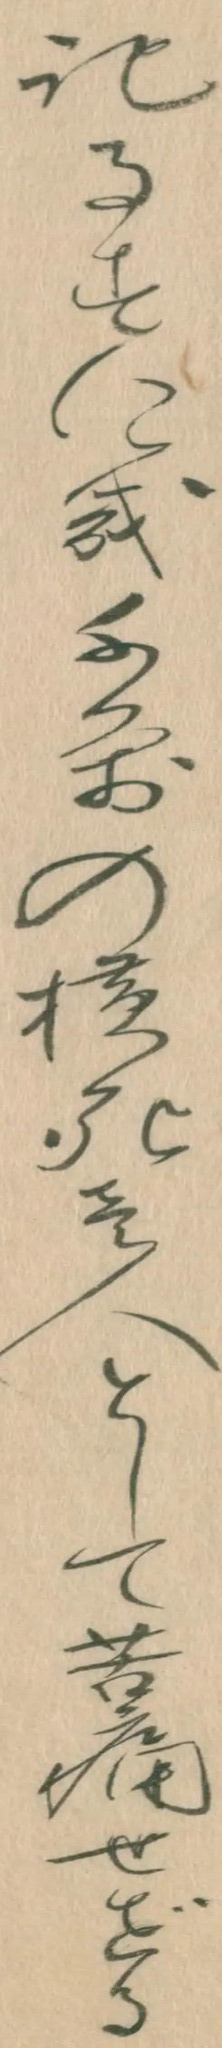記るすに幾千萬の横死壱人として苦痛せざる
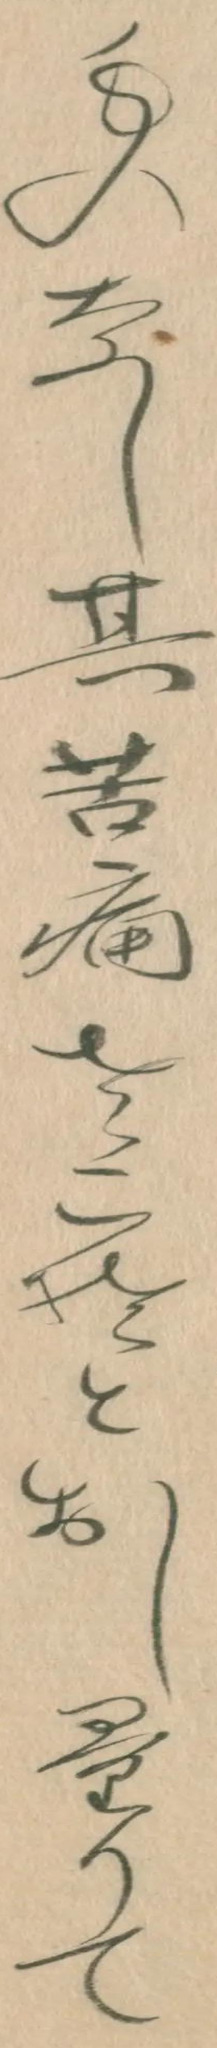ものなし其苦痛さこそとおし量りて
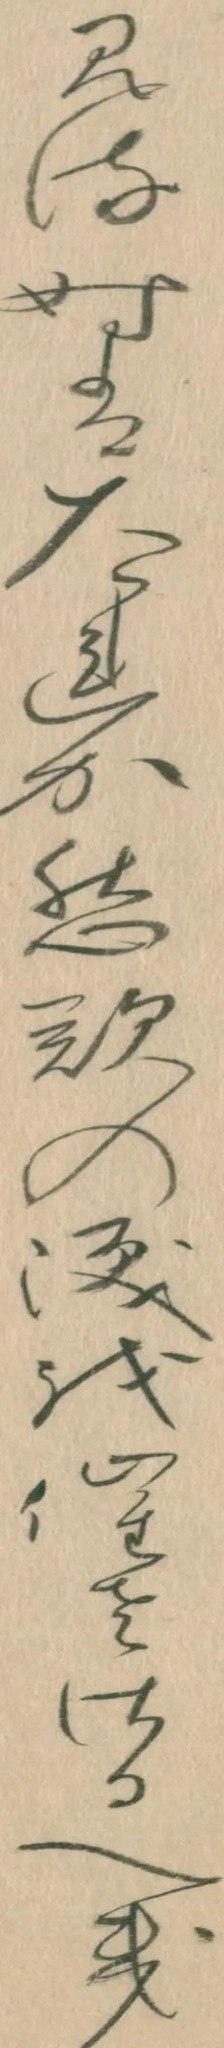見る時はたれか愁歎の涙を催ささるへき
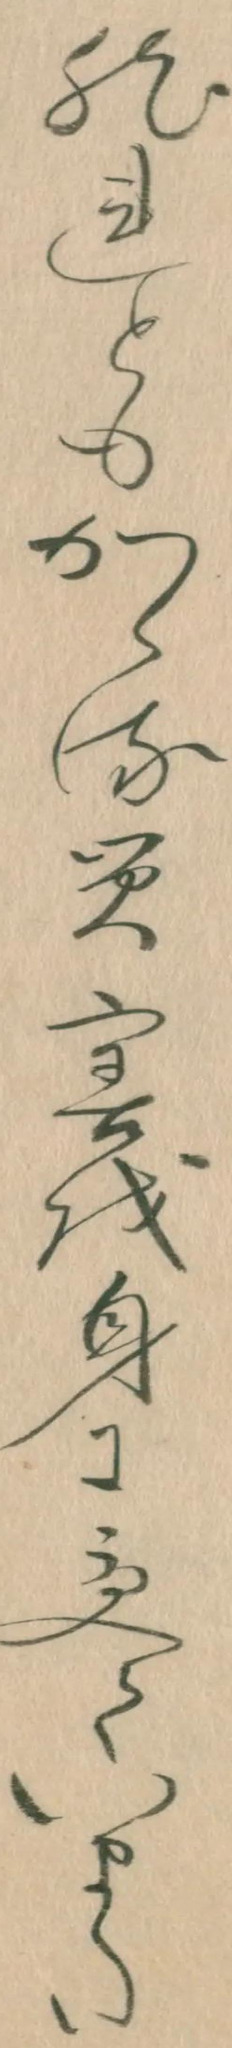然れともかゝる災害を身に受ていまた
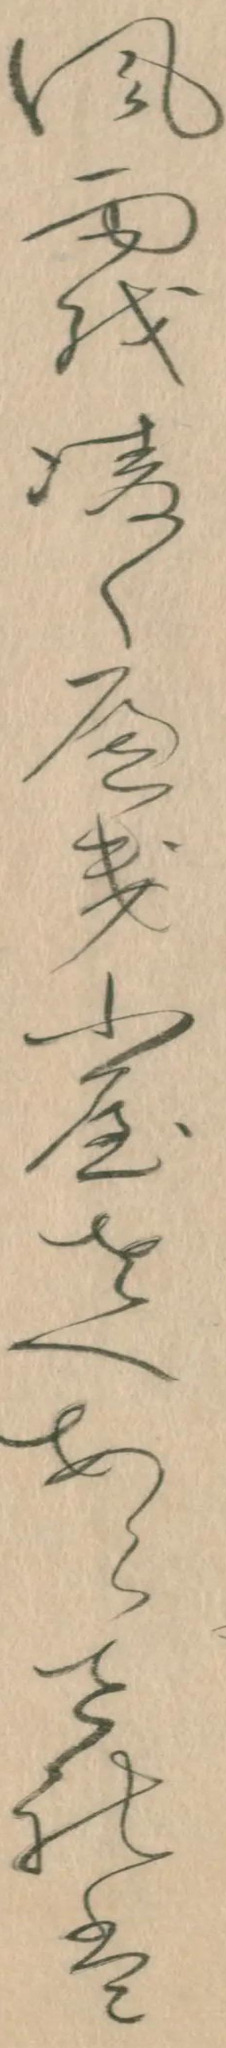風雨を凌くへき小屋さへあらされは
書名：俗語之種. [5]
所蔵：国立国会図書館 National Diet Library, JAPAN
